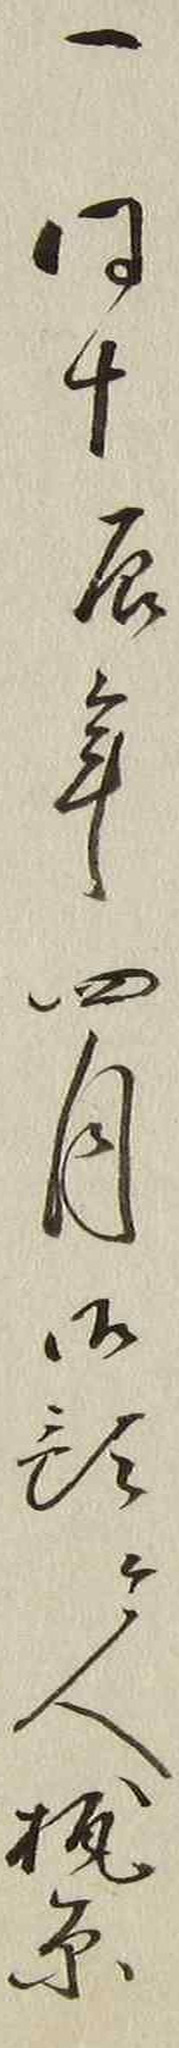一同十辰年月四御預ヶ人梶原
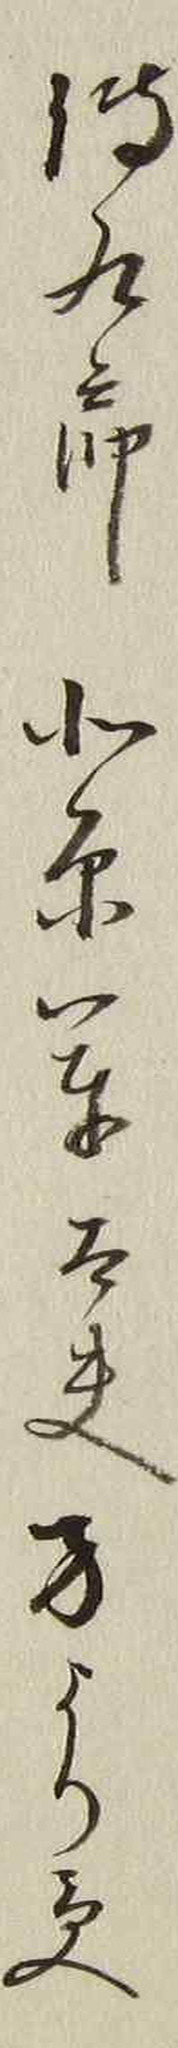伝九郎北原軍太夫方より受
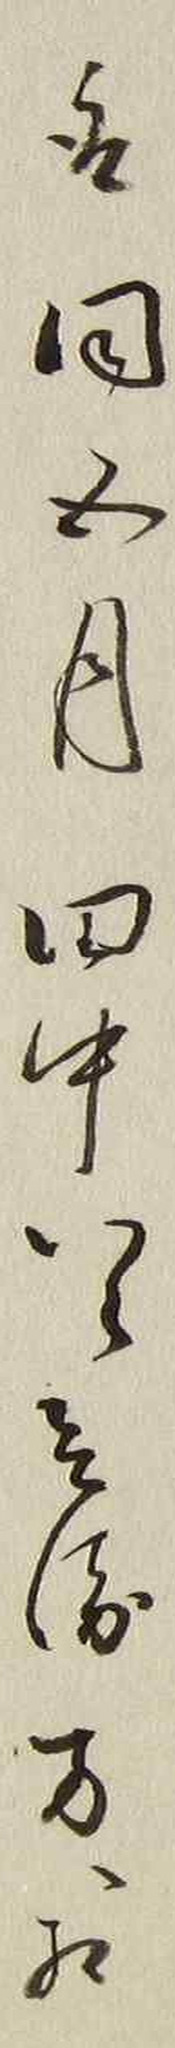取同五月田中八郎兵衛方へ相
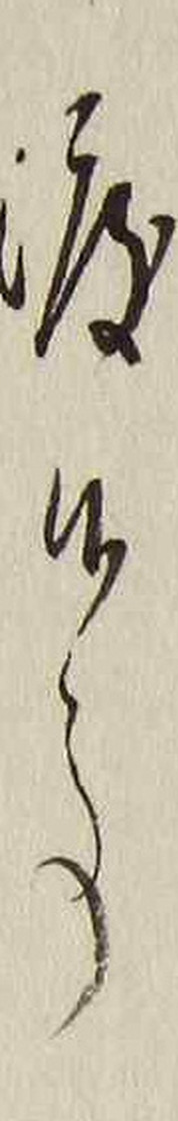渡候事
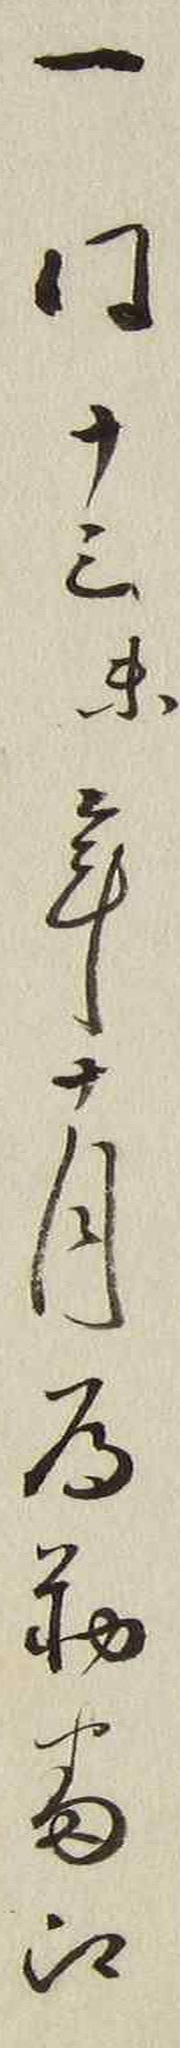一同十三未年月十月為勤番江
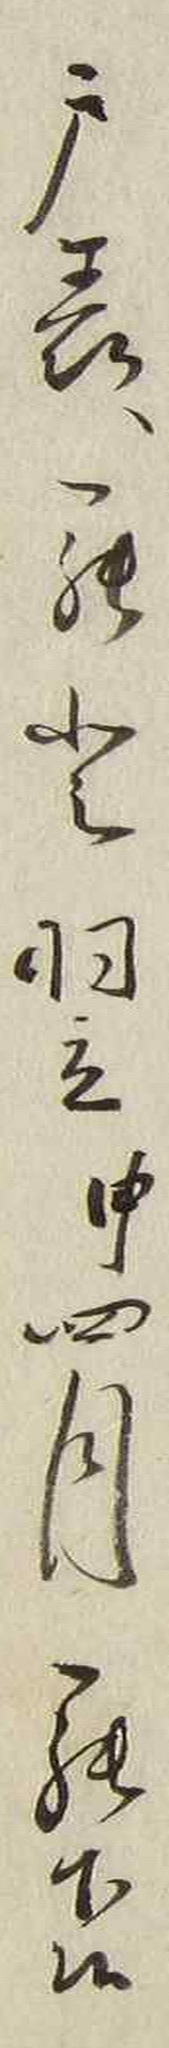戸表へ罷登翌申四月罷下候

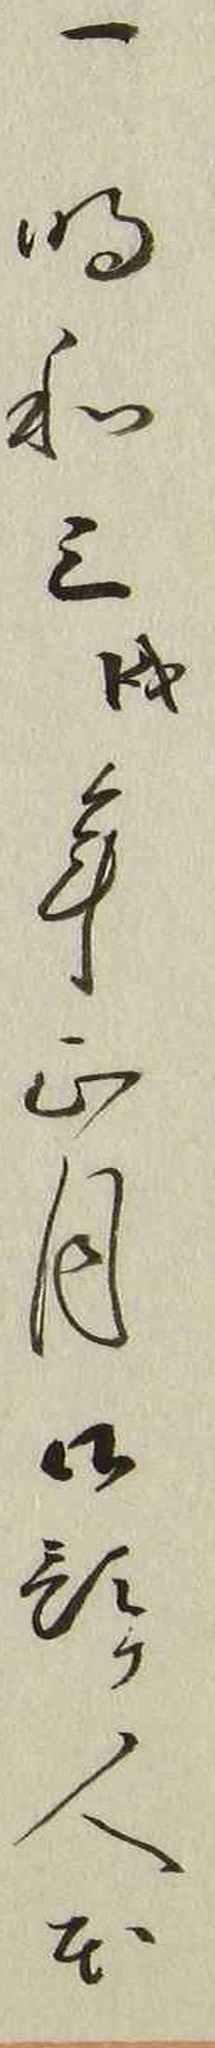一明和三戌年正月御預り人本
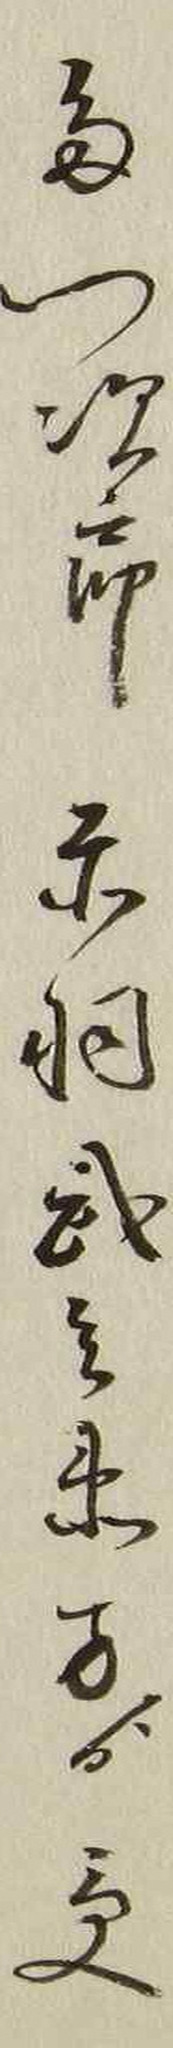多門次郎赤羽武兵衛方ゟ受
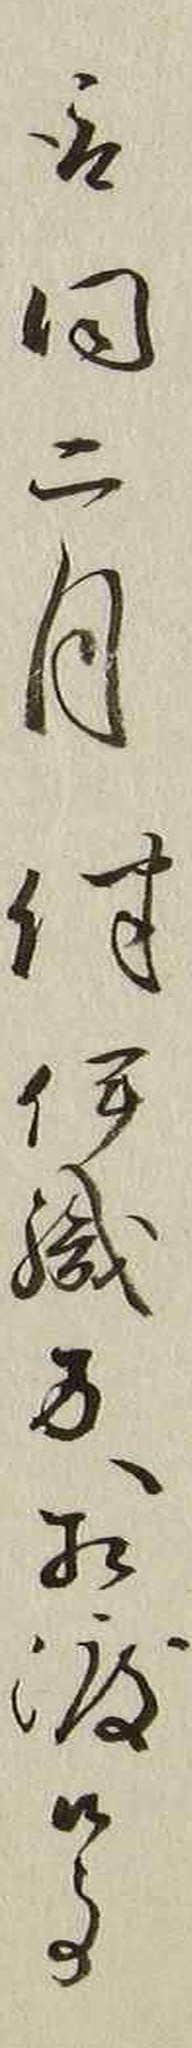取同二月伴伊織方へ相渡候事
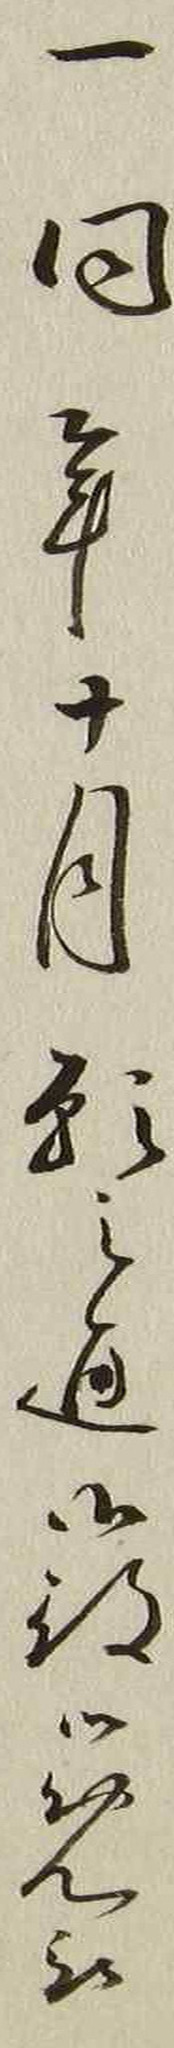一同年十月願之通御役御免被
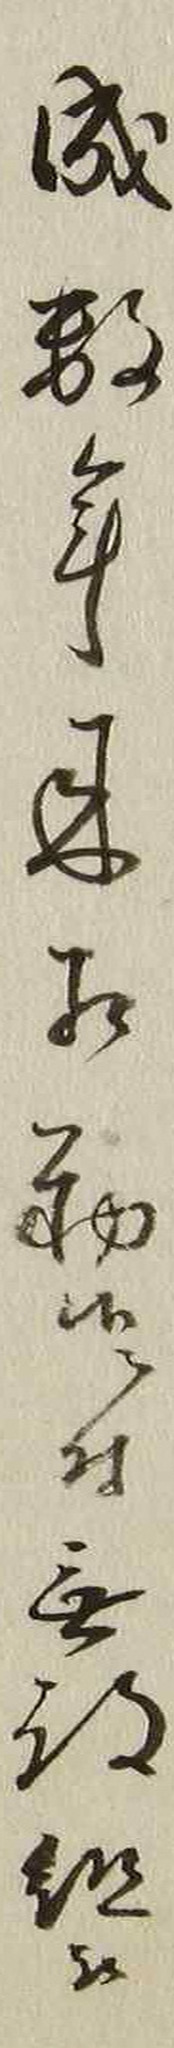成数年来相勤候に付無役組被
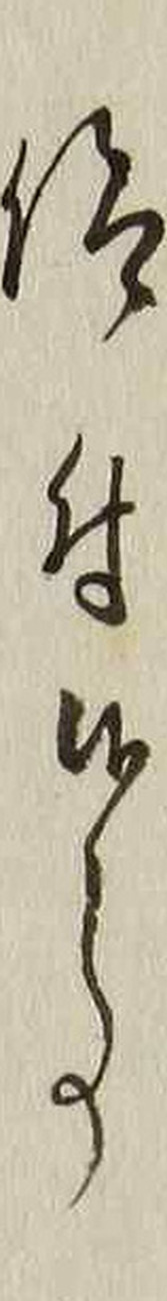仰付候事
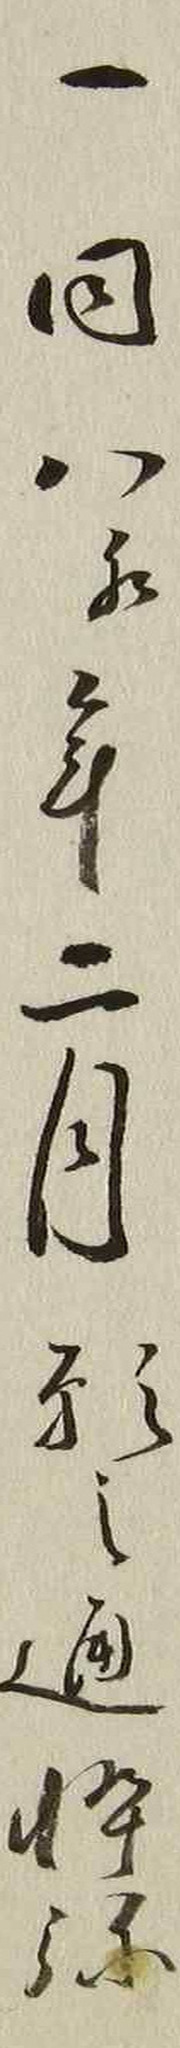一同八卯年二月願之通忰弥
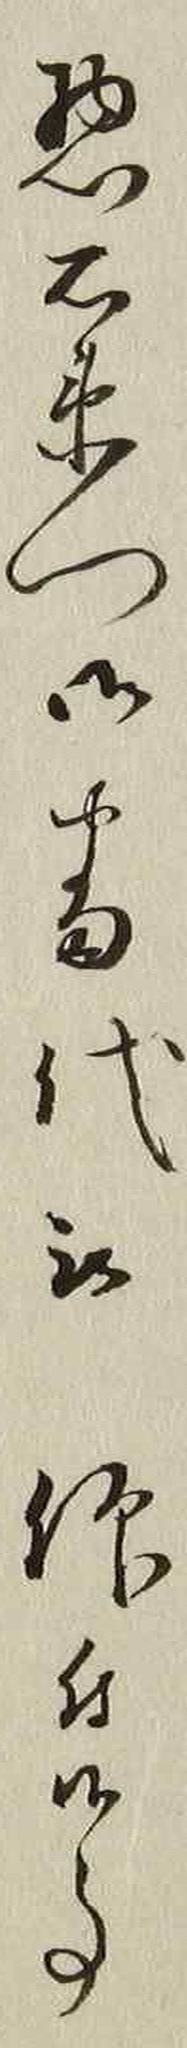惣右衛門御番代被仰付候事
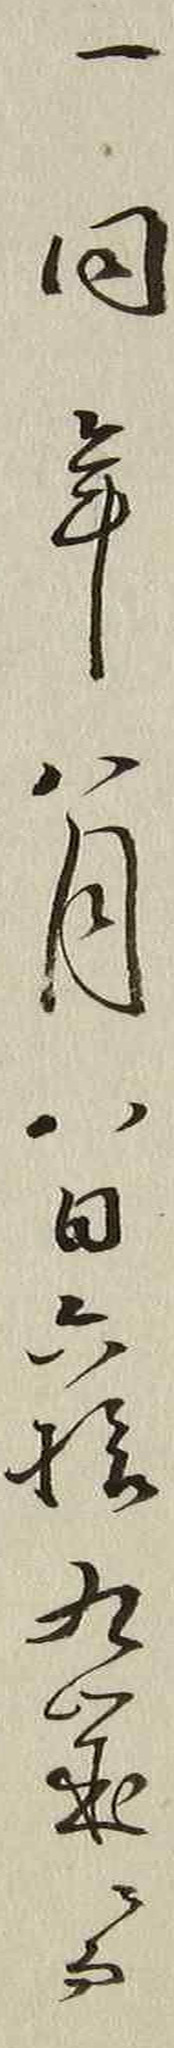一同年八月八日六拾九歳に而
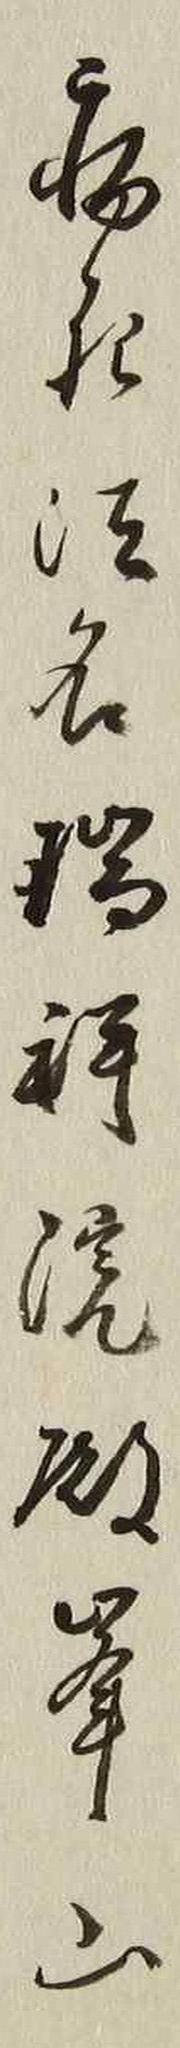病死法名瑞祥院殿峯山
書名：諸士系譜　巻之159　な之部1
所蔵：会津若松市立会津図書館
